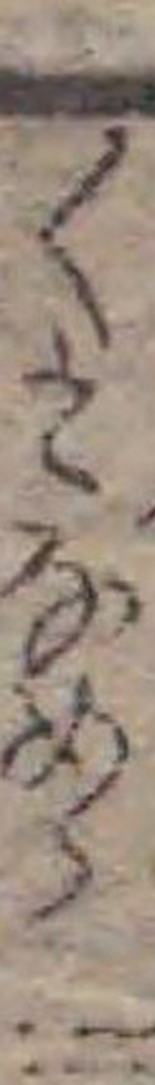〳〵となめら
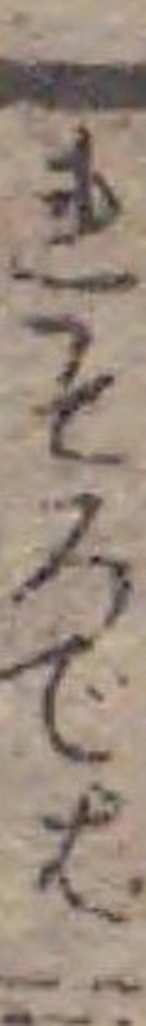れそろでは
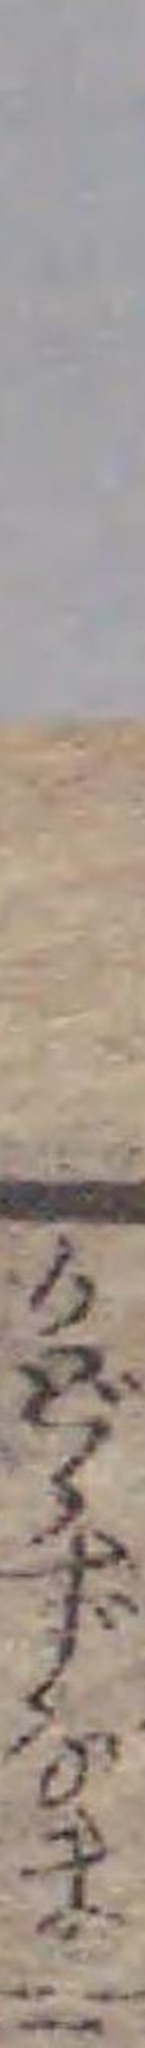かどらずなま
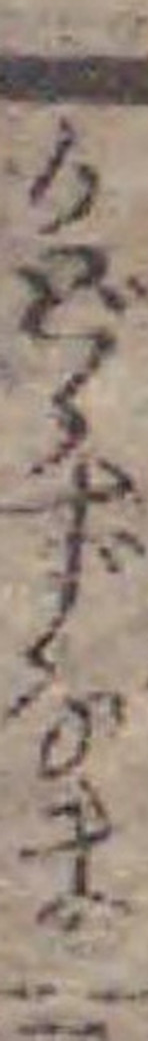かどらずなま
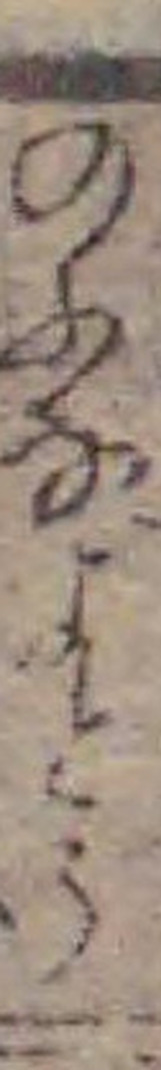のふなよとう
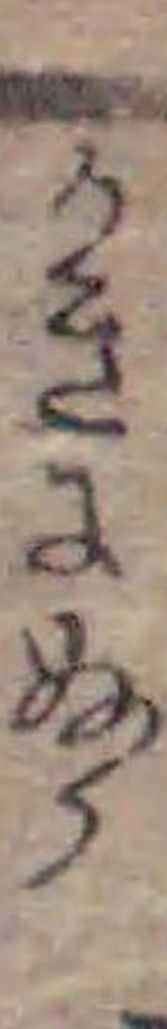かきにぬら
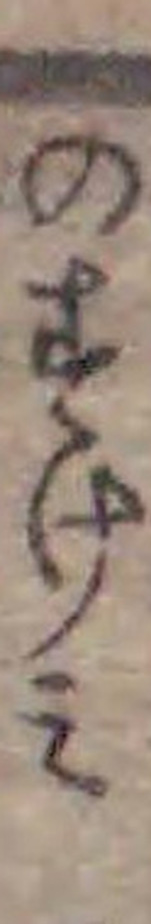のすけみ
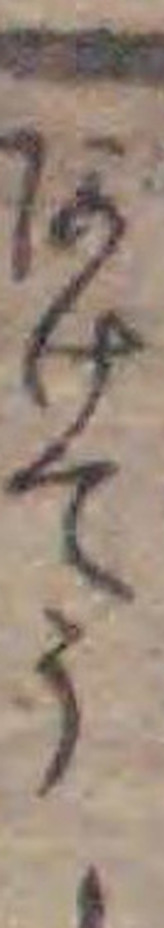あけてう
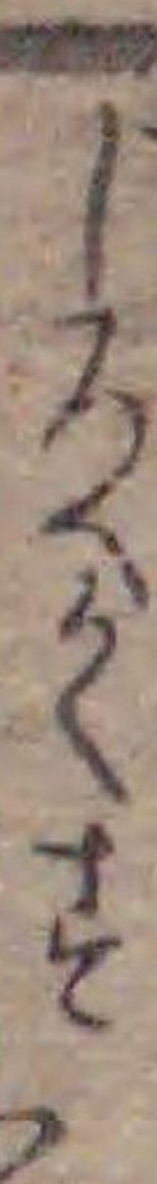しろへかくす

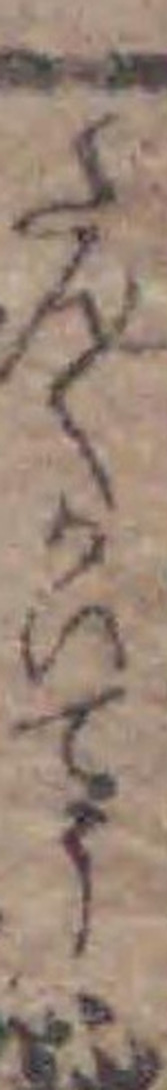たん〳〵かいてう
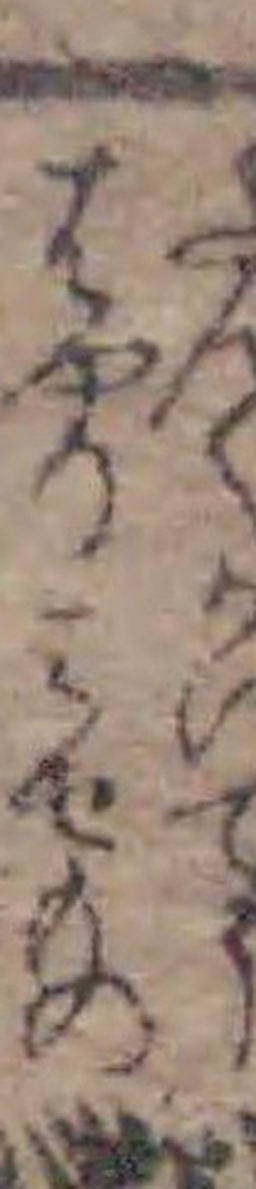はやりみせもの
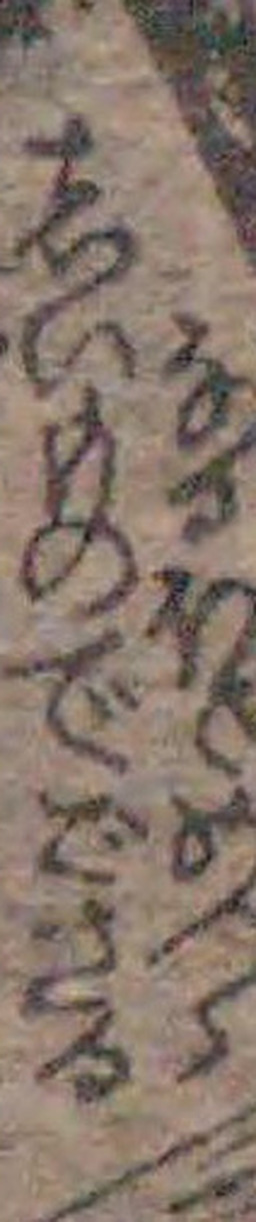しいものでござる
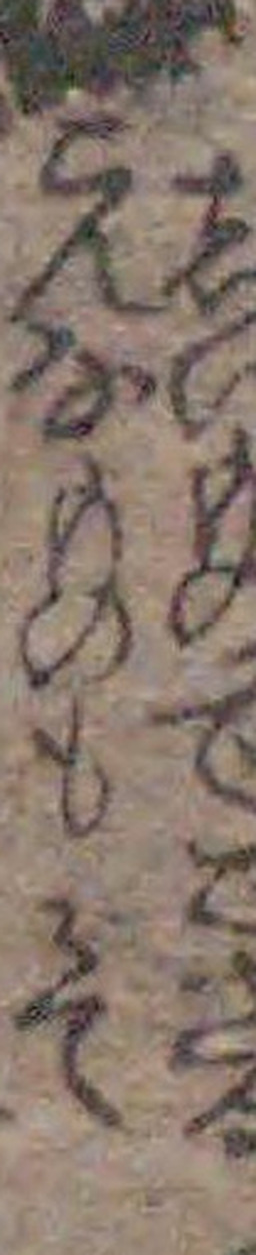こんなものもみて
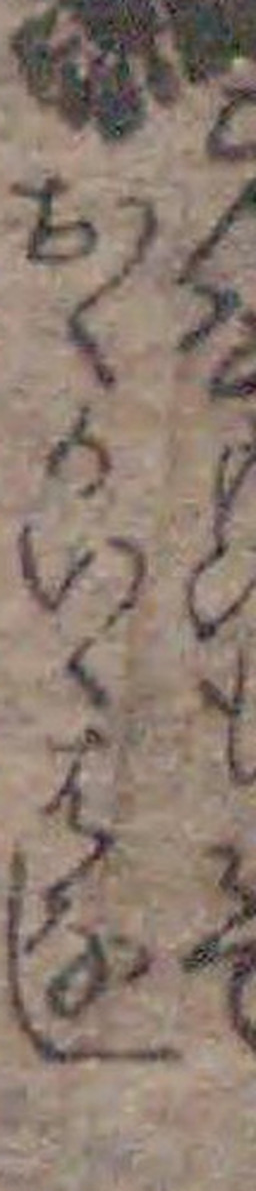おくかいゝはなし
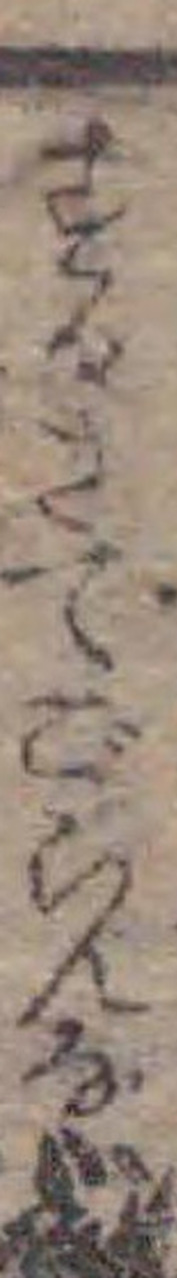するさてごらんな
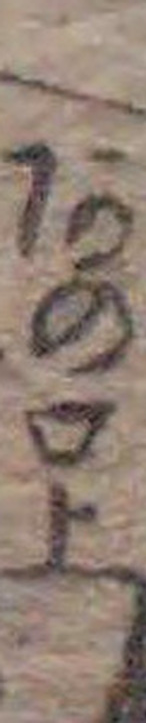あの口上
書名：化物七段目 : 2巻
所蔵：国立国会図書館 National Diet Library, JAPAN
